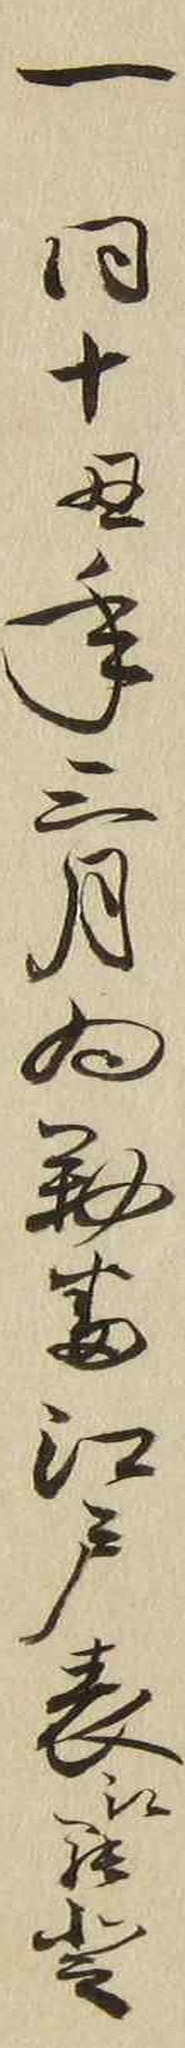一同十丑年三月為勤番江戸表江罷登
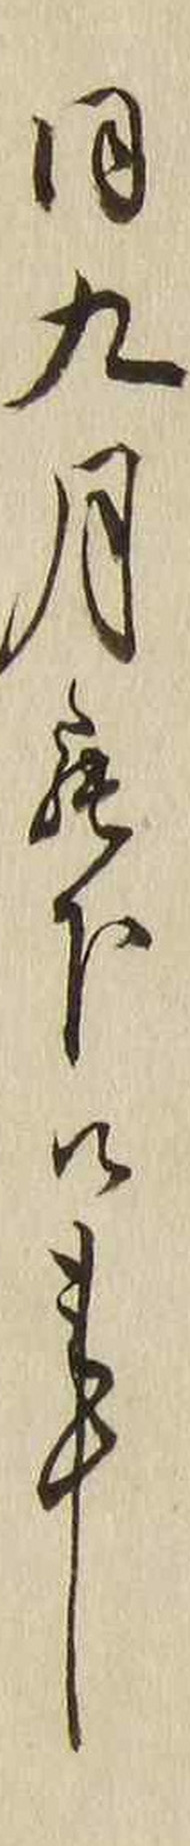同九月罷下候事
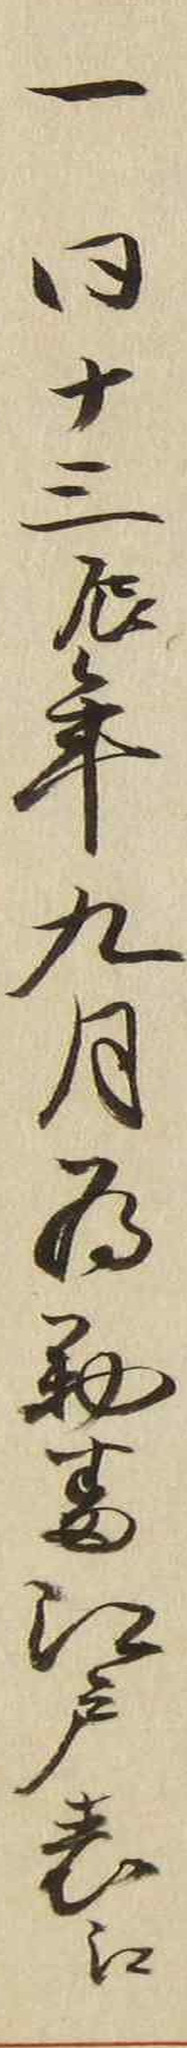一同十三辰年九月為勤番江戸表江

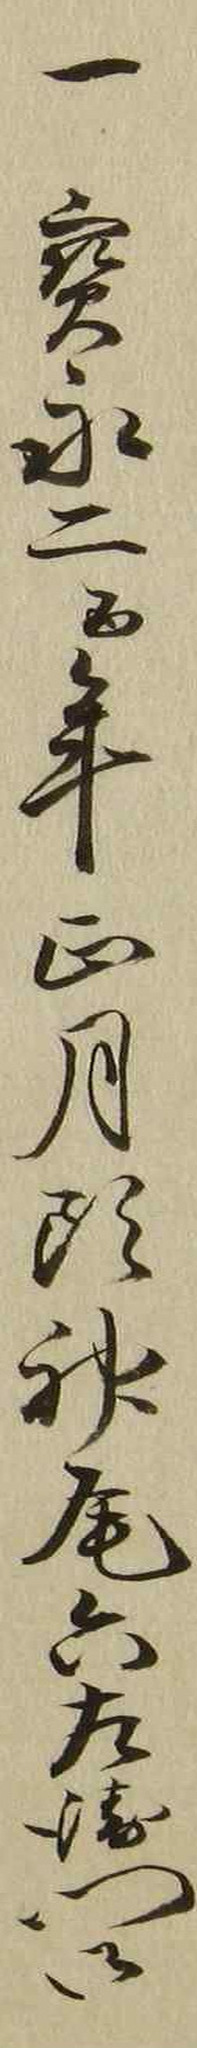一宝永二酉年正月頭神尾六左衛門御
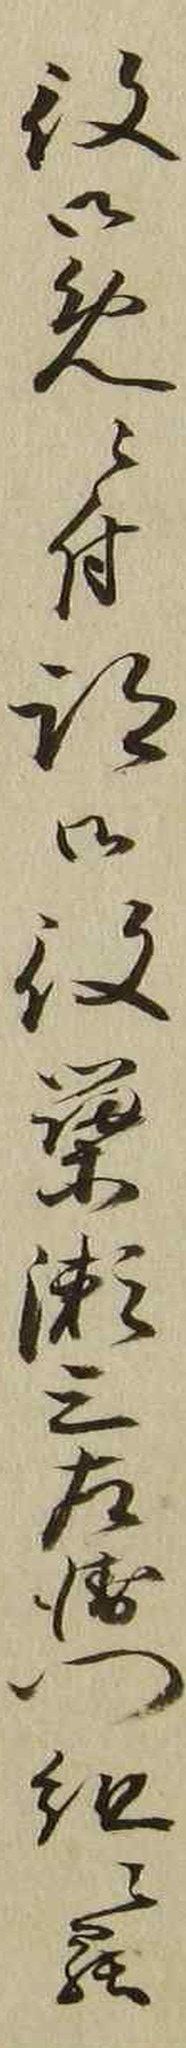役御免ニ付跡御役簗瀬三左衛門組ニ罷
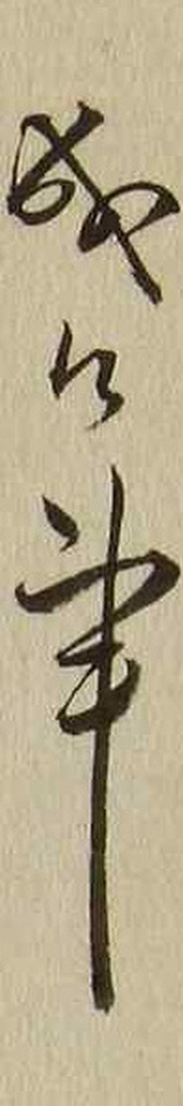成候事
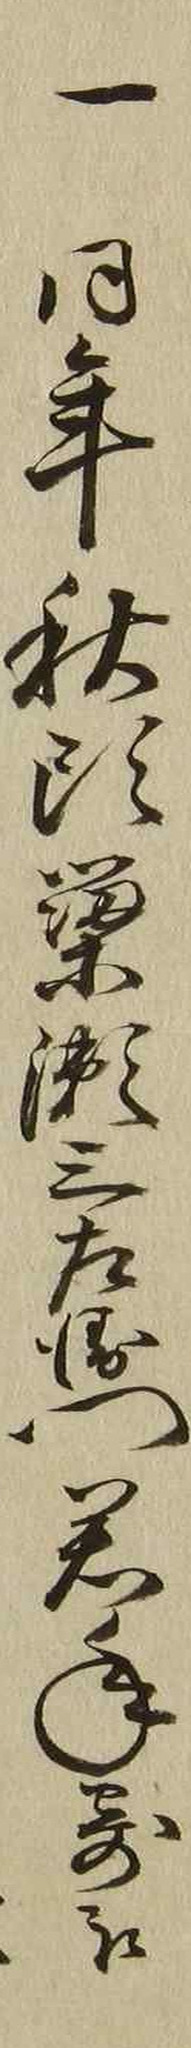一同年秋頭簗瀬三左衛門若年寄被
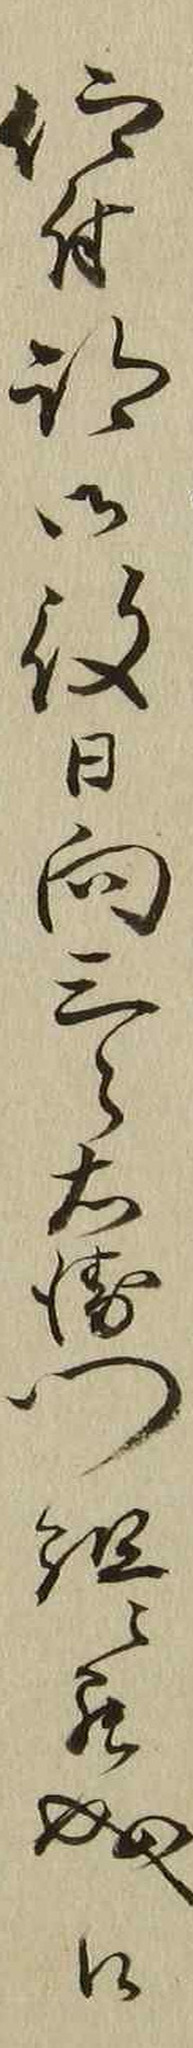仰付跡御役日向三郎右衛門組ニ罷成候
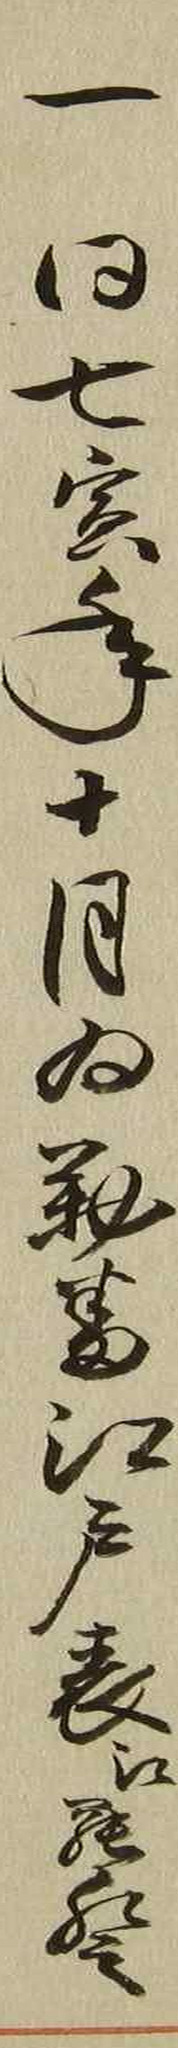一同七寅年十月為勤番江戸表江罷登
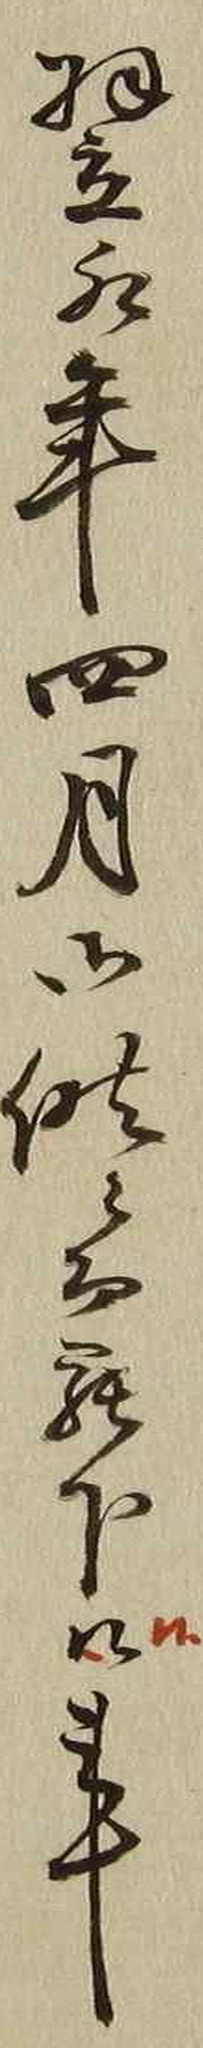翌卯年四月御供ニ而罷下候事
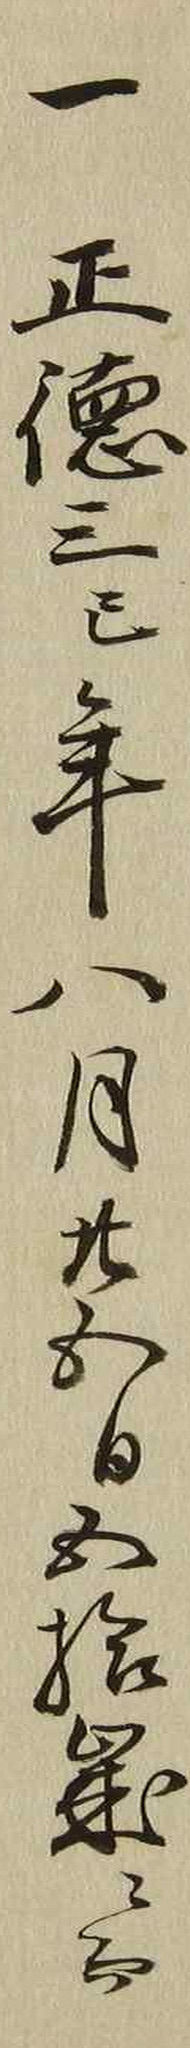一正徳三巳年八月廿五日五拾歳ニ而
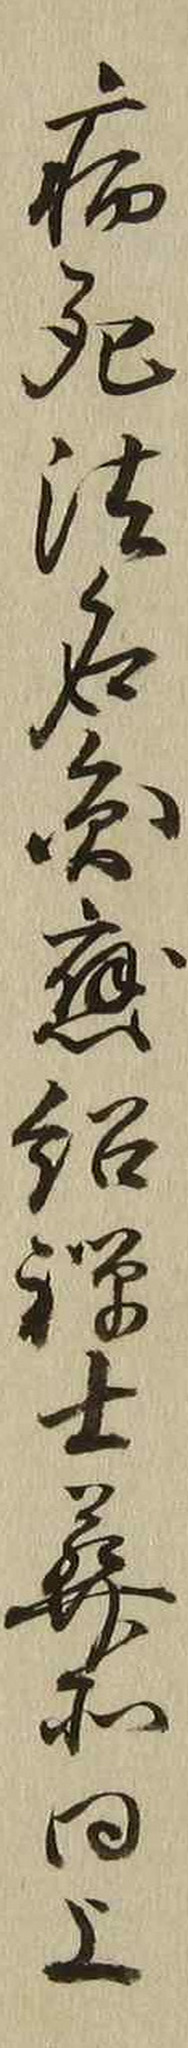病死法名円応紹禅士葬所同上
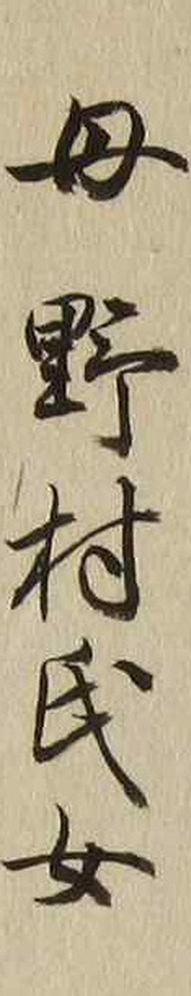母野村氏女
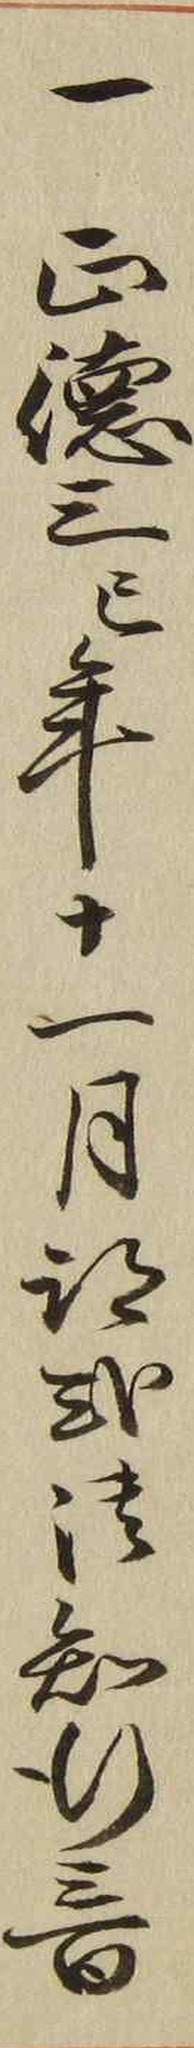一正徳三巳年十一月跡式御知行三百
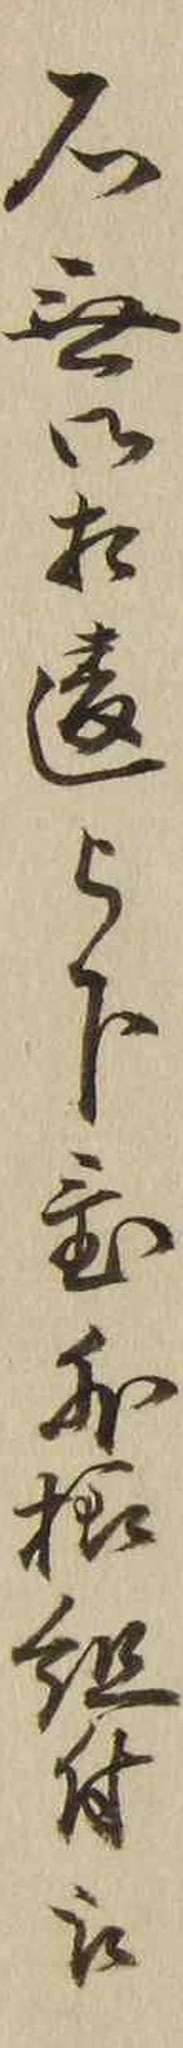石無御相違被下置外様組付被

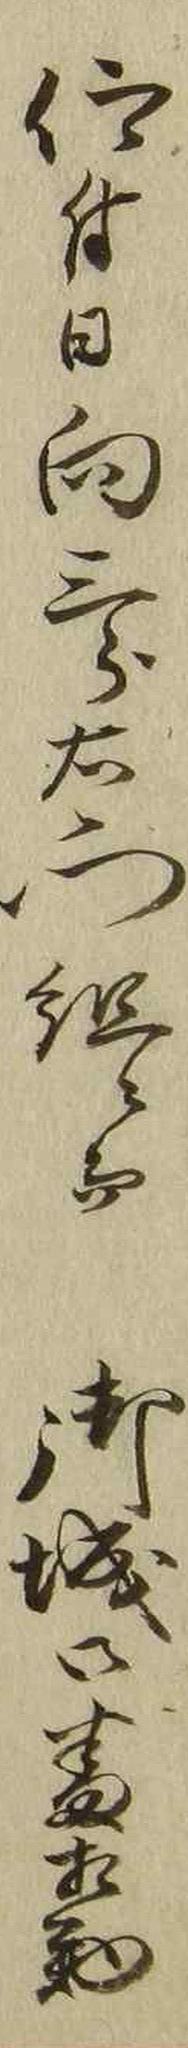仰付日向三郎右衛門組ニ而御城御番相勤
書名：諸士系譜　巻之60　と之部3
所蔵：会津若松市立会津図書館
